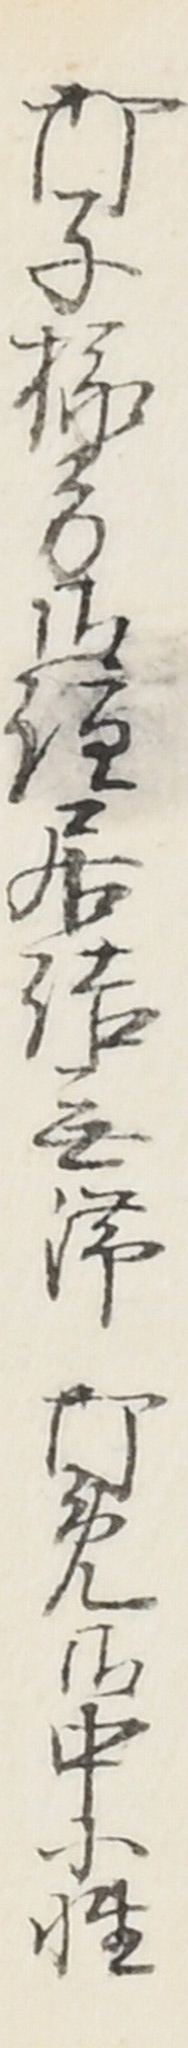御子様方御住居詰無滞御免御中小性
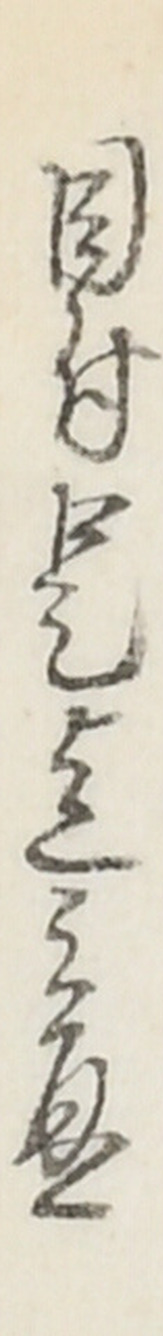目付是迄之通
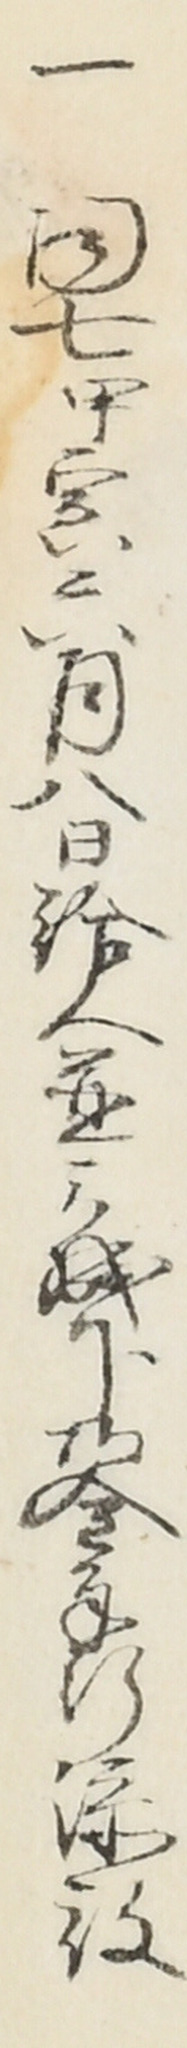一同七甲寅六月八日給人並被成下御金奉行添役
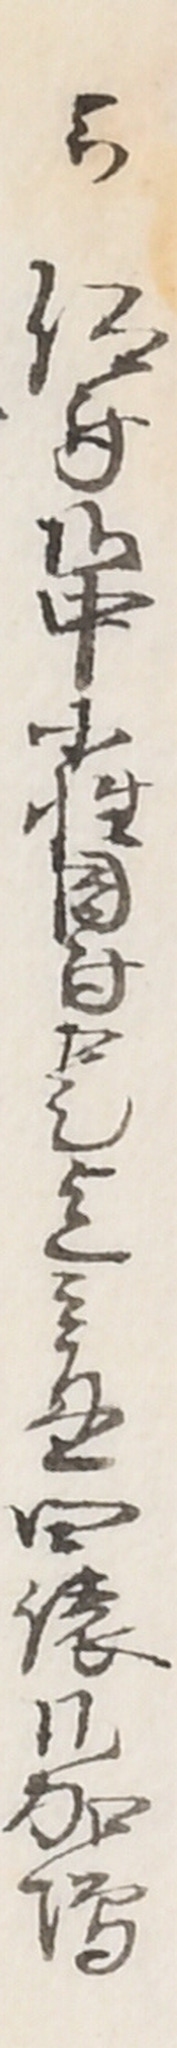被仰付御中小性目付是迄之通四俵御加増
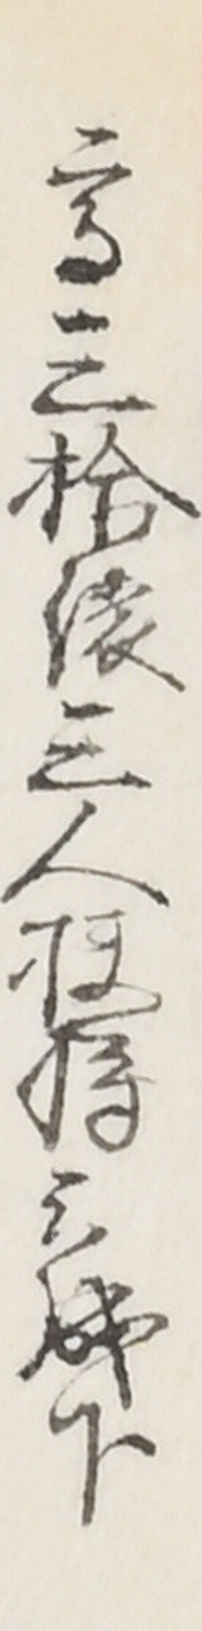高三拾俵三人扶持被成下
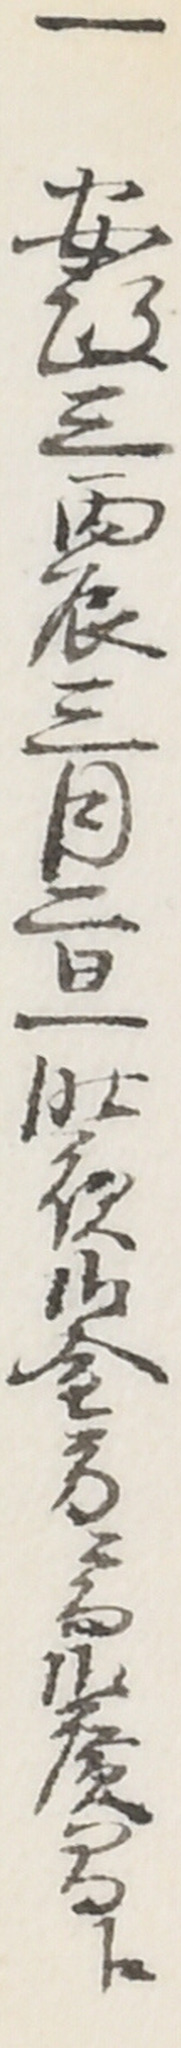一安政三丙辰三月二日一昨夜御金方ニ而御広間江
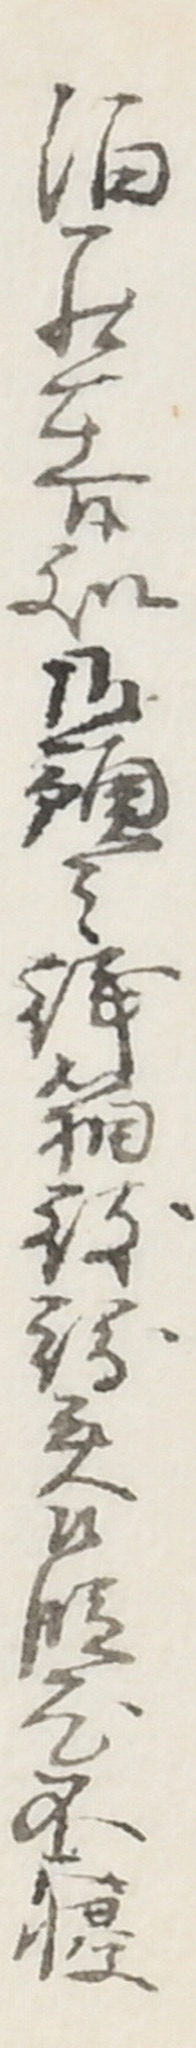泊罷在候処御預之銭箱致紛失候段尤不寝
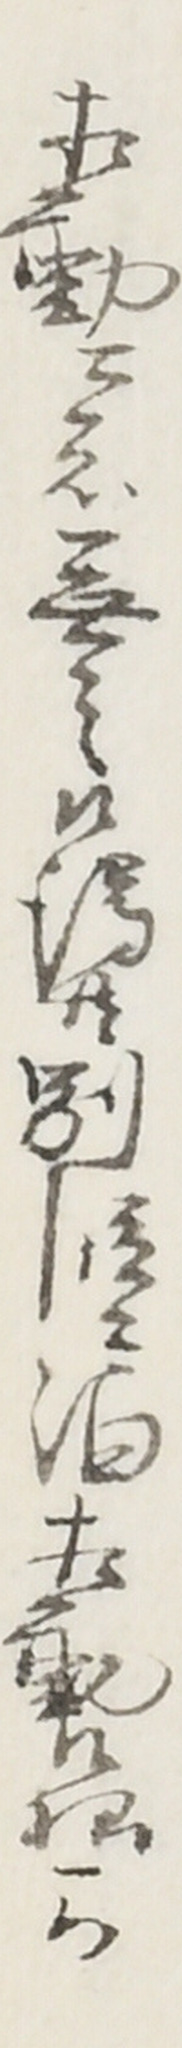相勤ニ者無之候得共別段ニ泊相勤候様被
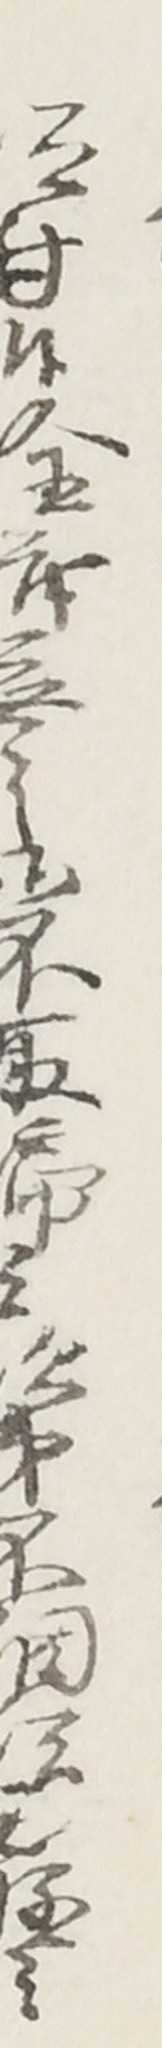仰付候詮茂無之御不取締之次第不調法之極之
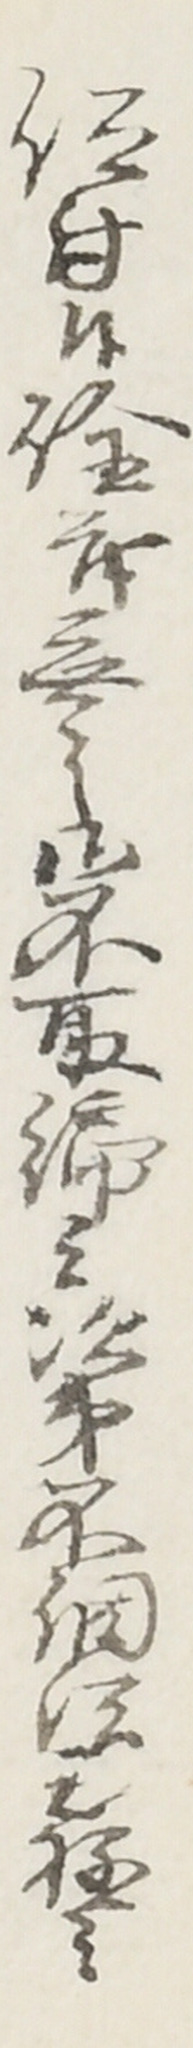仰付候詮茂無之御不取締之次第不調法之極之
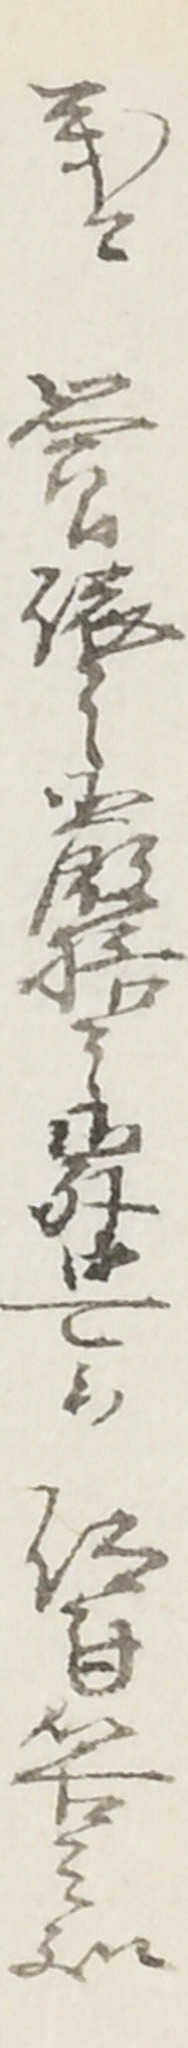義ニ思召候依之厳格之御咎可被仰付筈之処
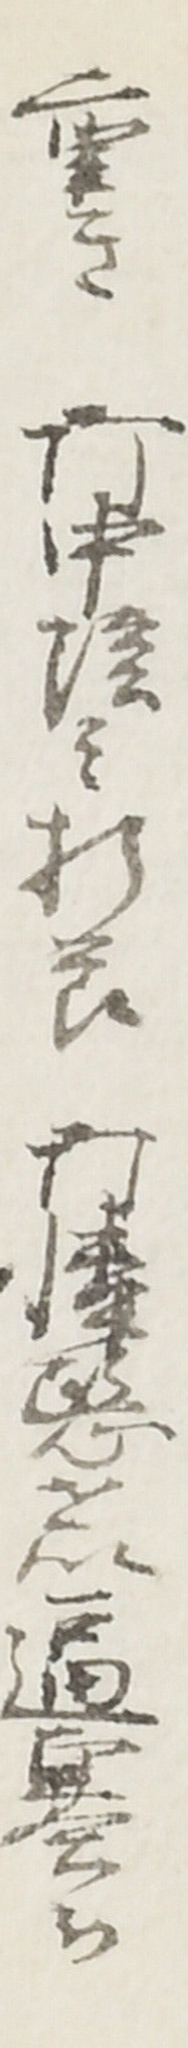重き御中陰之折節御憐愍を以逼塞被
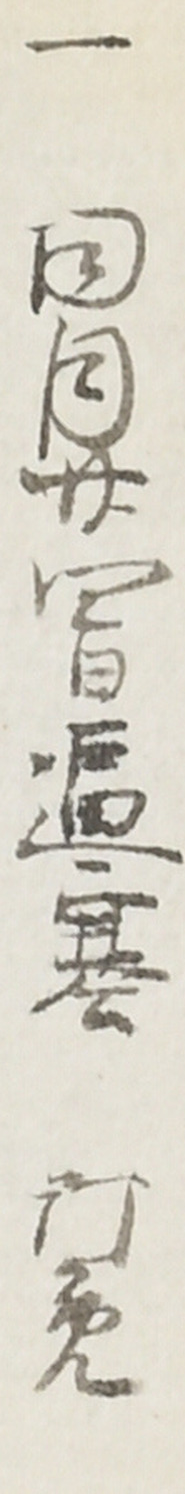一同月廿四日逼塞御免
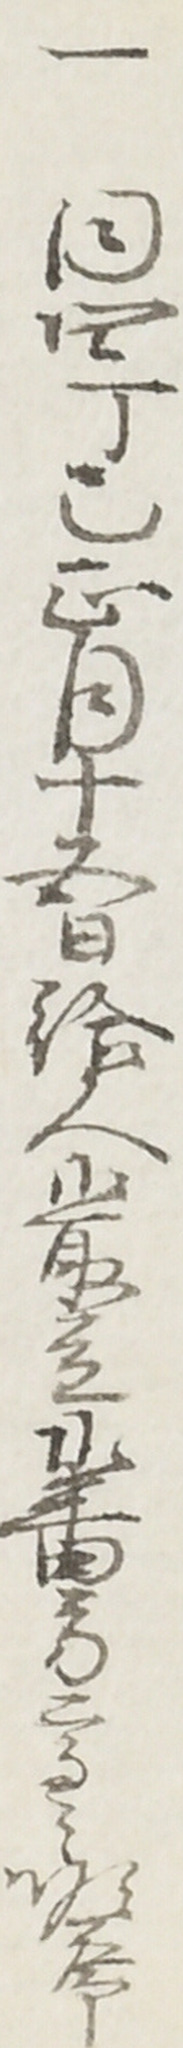一同四丁巳正月十五日給人御取立御番方高之順席
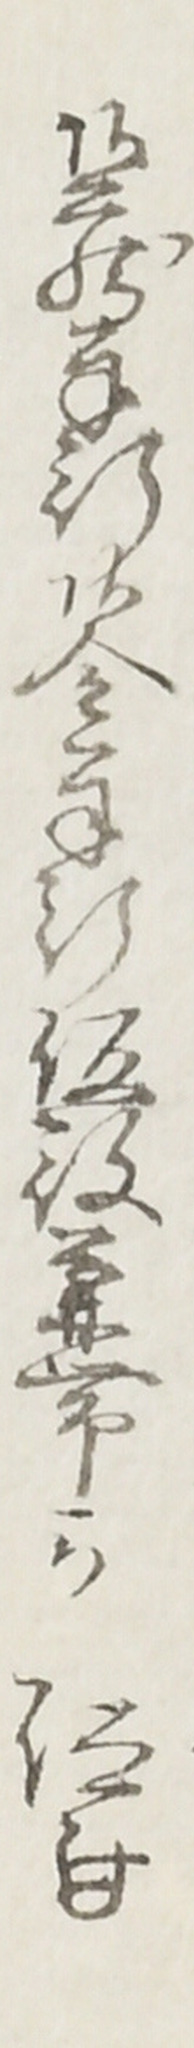御蔵奉行御金奉行仮役兼帯被仰付
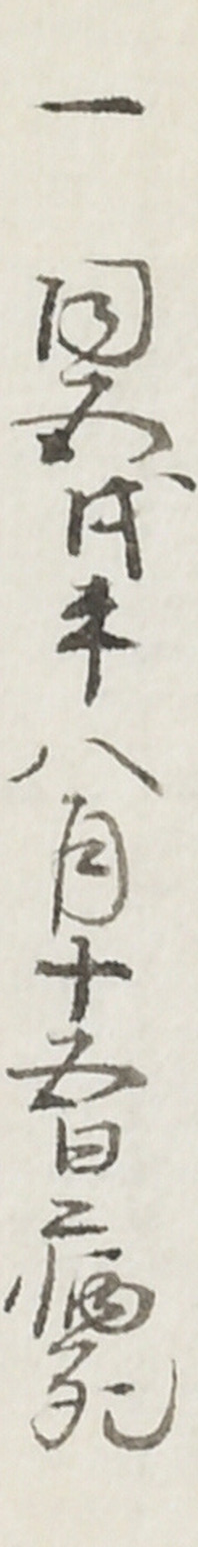一同五戊午八月十五日病死
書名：給人諸士勤仕録（七）
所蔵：伊那市立高遠町図書館・合同会社AMANE
